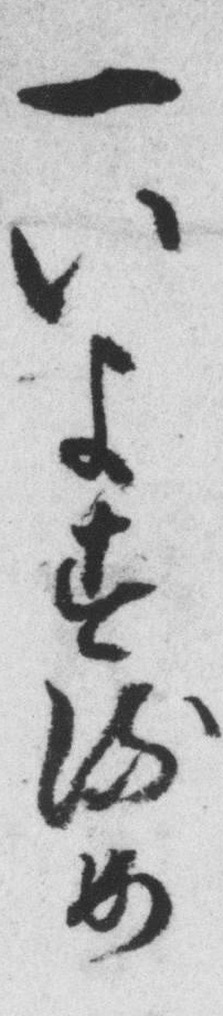一いよするめ
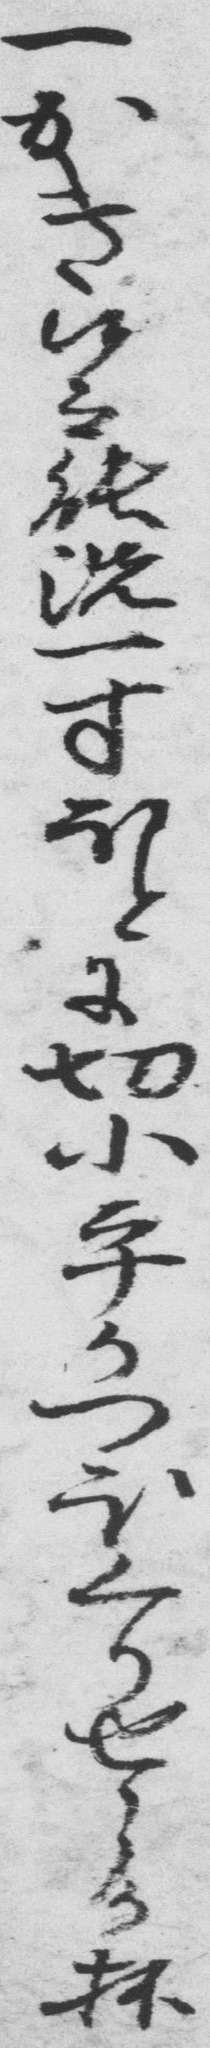一かき候て能洗一寸ほとに切小平かつほくりせうか抔
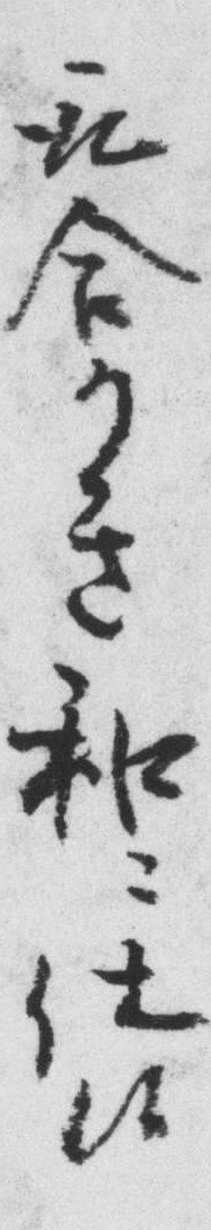取合かき和に仕候
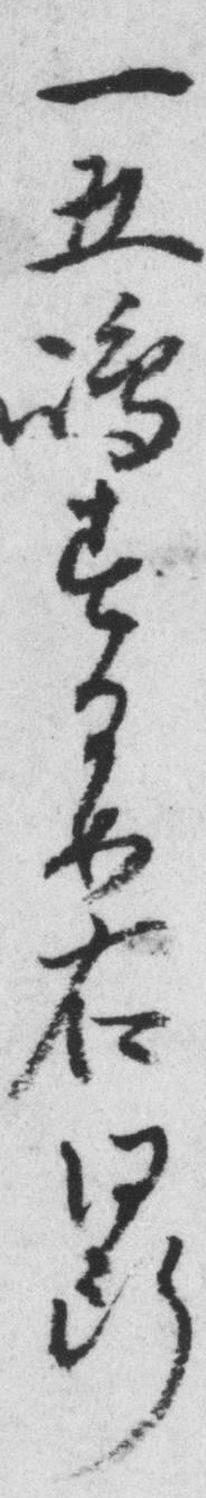一五島するめ右同断

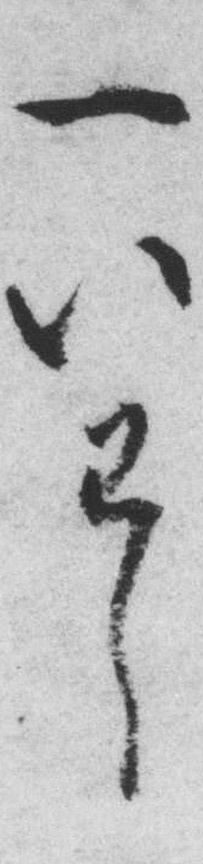一いわし
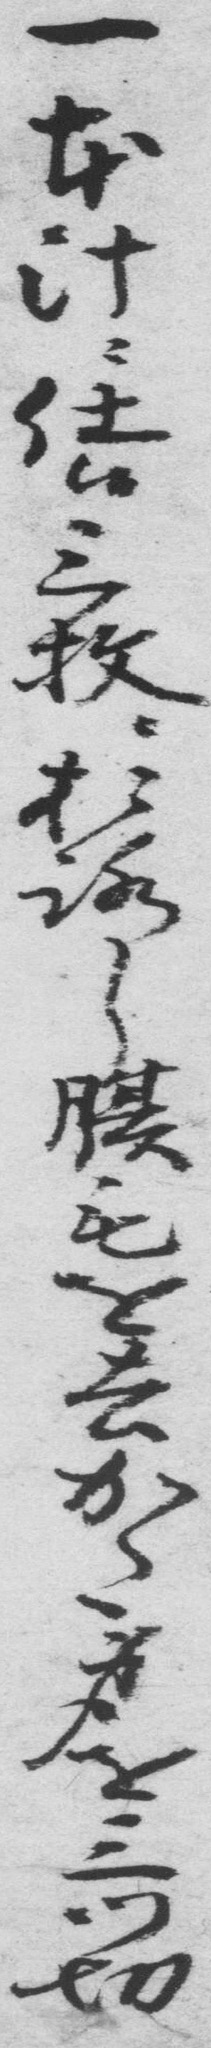一本汁に仕候三枚におろし腹毛を去かた身を三つ切
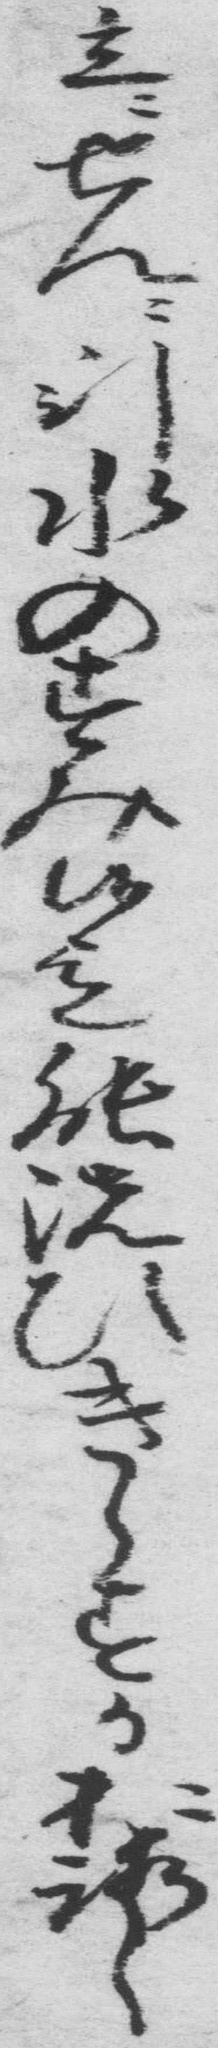立にせんに引水のすみ候迄能洗ひきらすかおろし
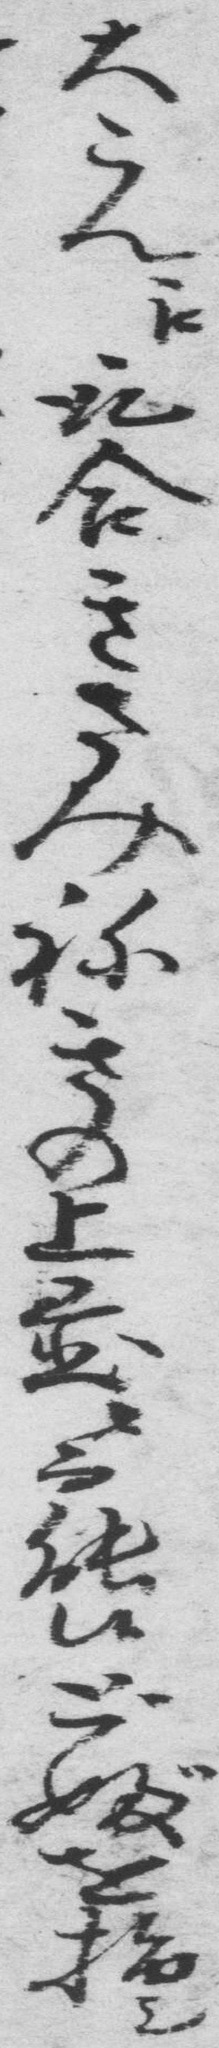大こんえ取合きさみねきの上置にて能候どぶを指し
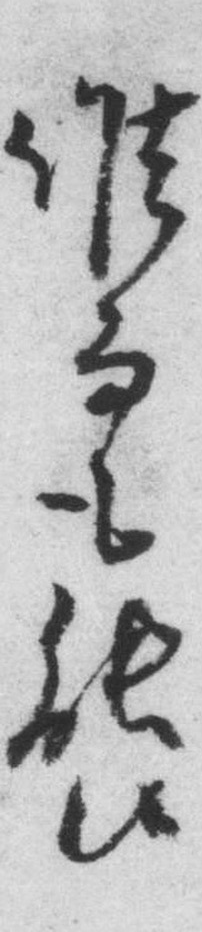作るも能候
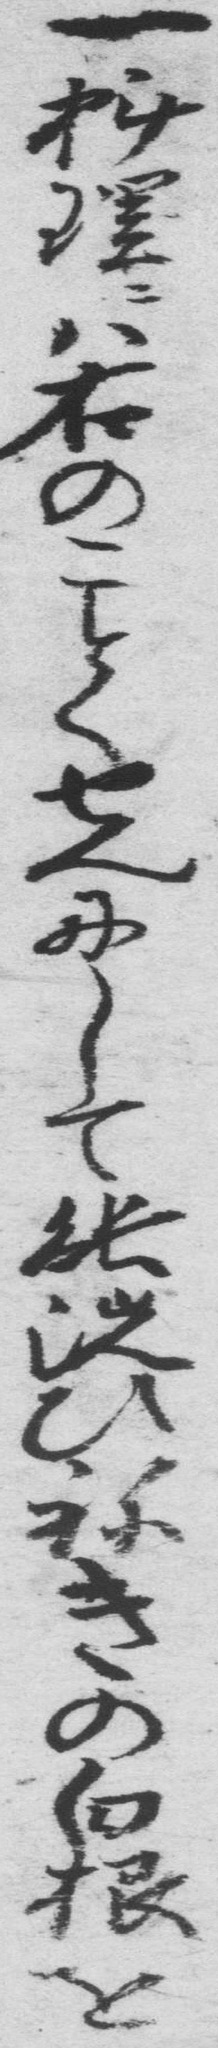一料理には右のことくせんにして能洗ひねきの白根を
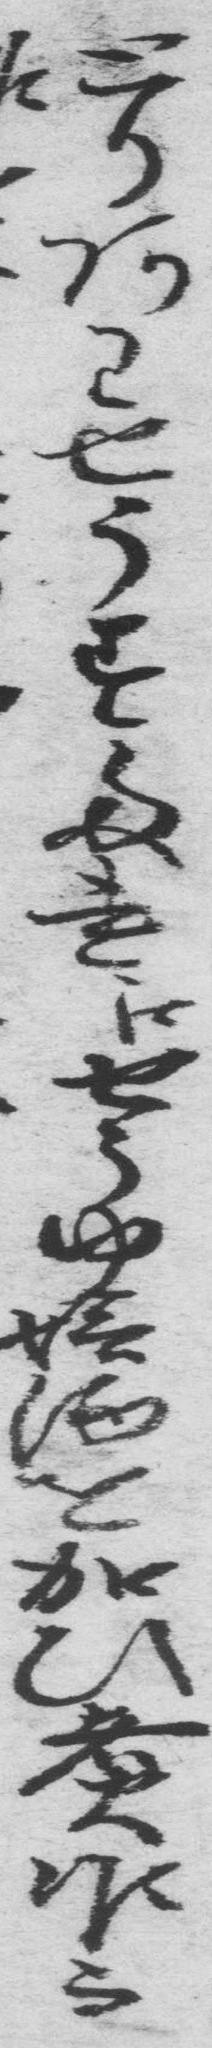とりあわせうすたれえせうゆ塩酒を加ひ煮作て
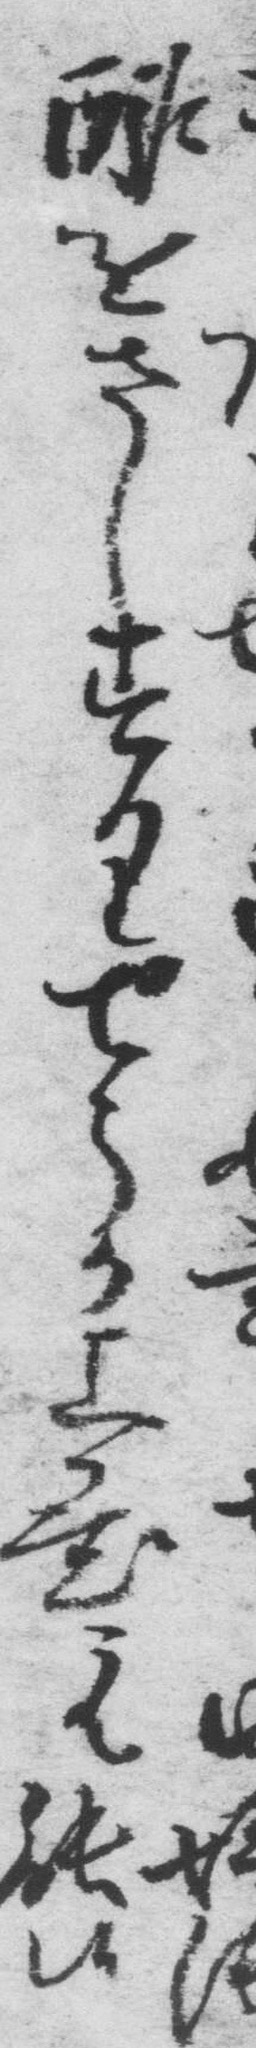酢をさしすりせうか上置にて能候
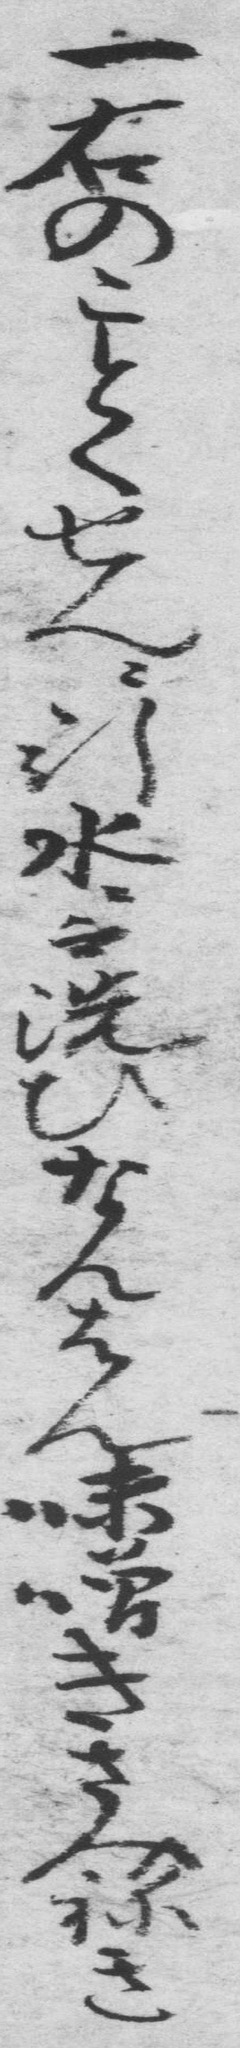一右のことくせんに引水にて洗ひなんはん味噌きさみねき
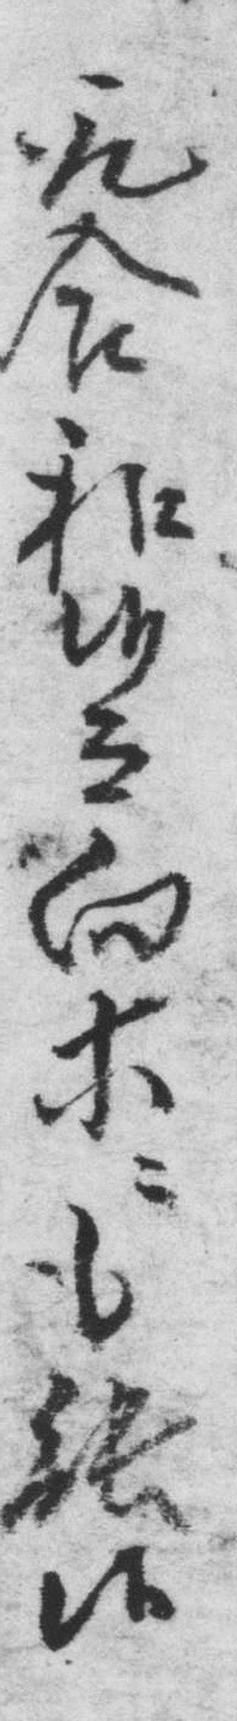取合和候て向等にも能候
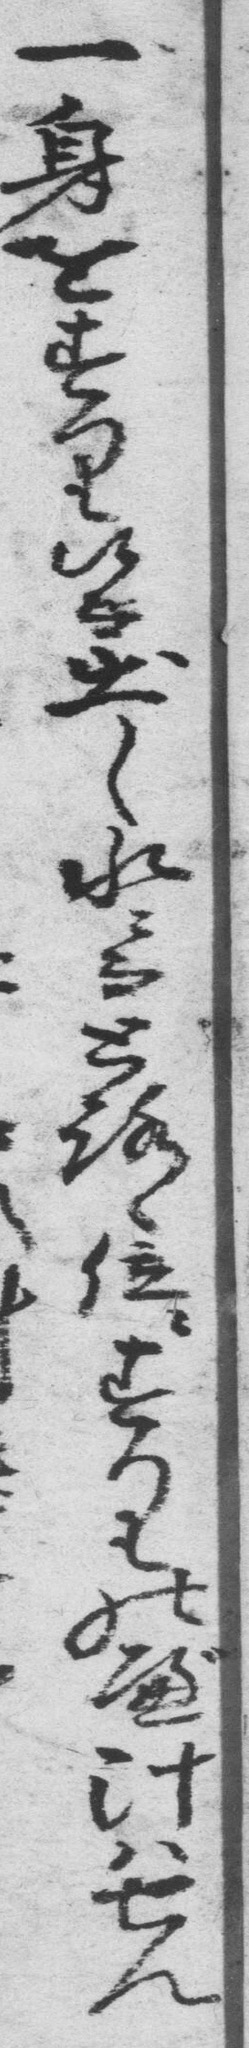一身をすり候て出し水にてとろゝ位にすりのべ汁はせん
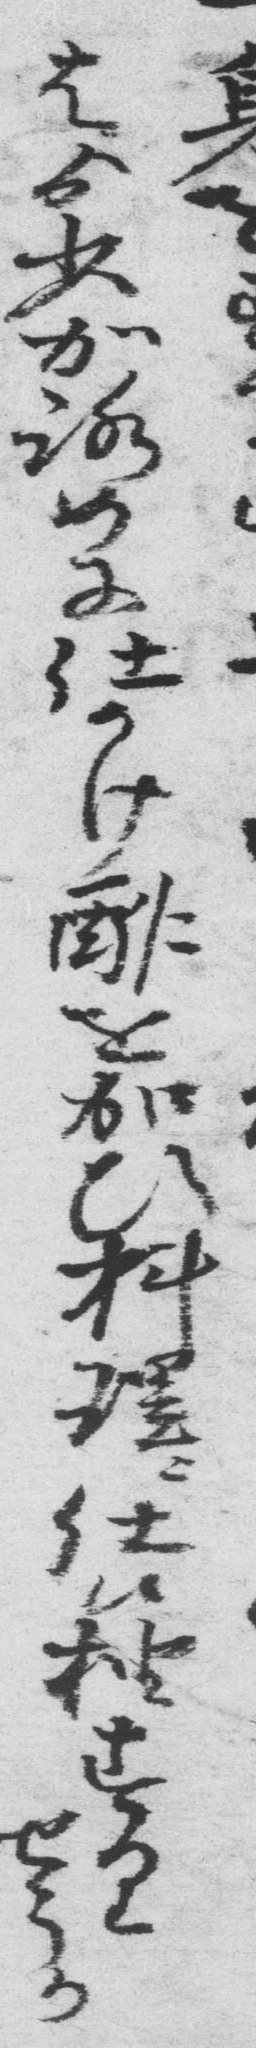はゟ少かろめに仕かけ酢を加ひ料理に仕候すりせうか
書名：料理集
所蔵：大阪府立大学学術情報センター 国文学研究資料館
